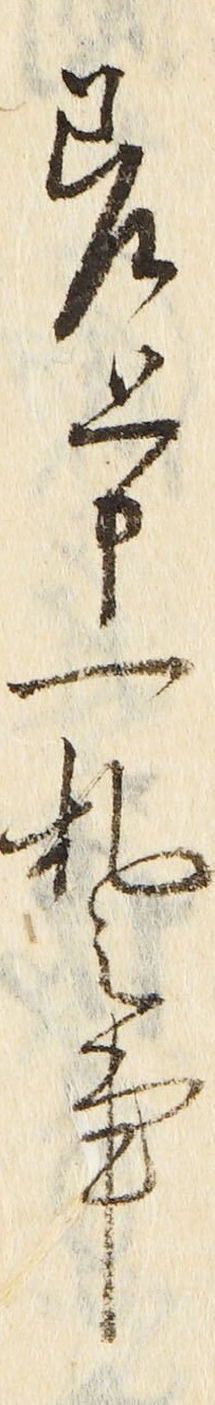差上申一札之事
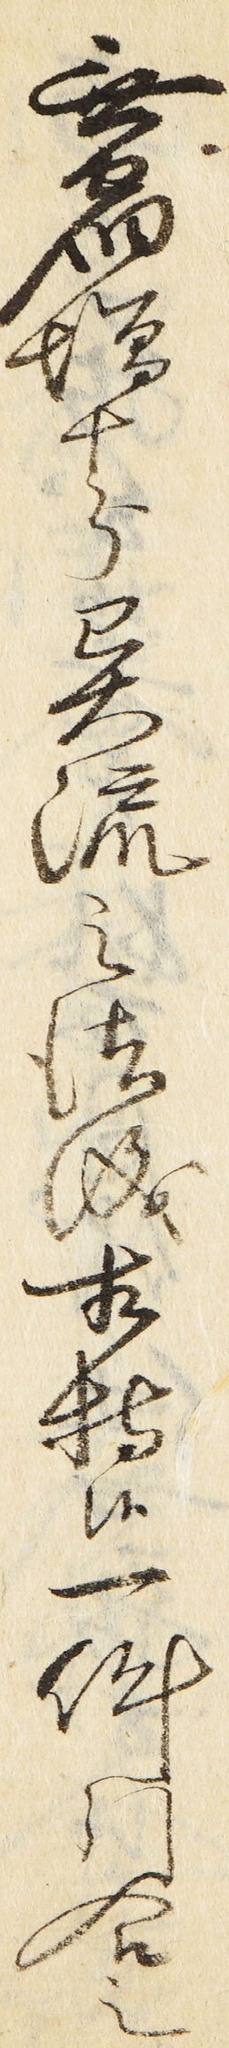無宿増十郎異流之法儀相持候一件引合之
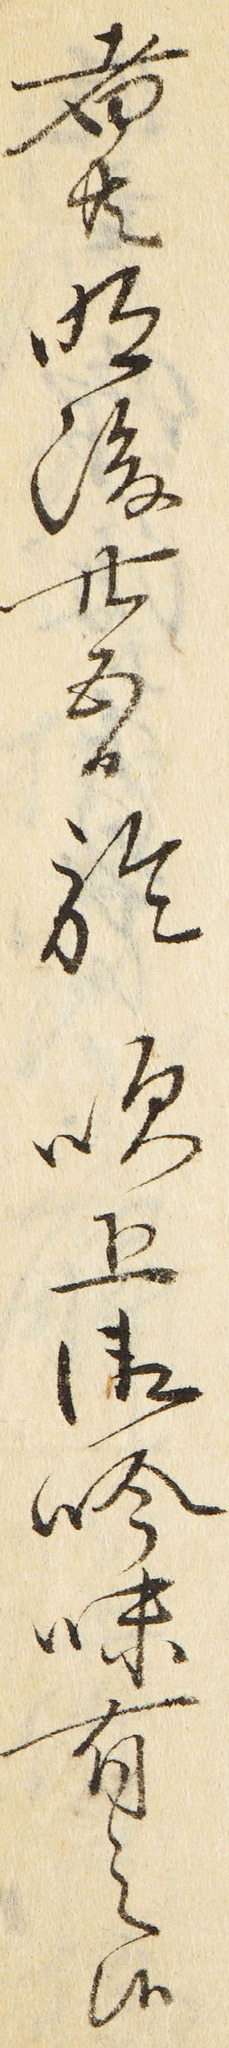者共明後廿五日於吹上御吟味有之候

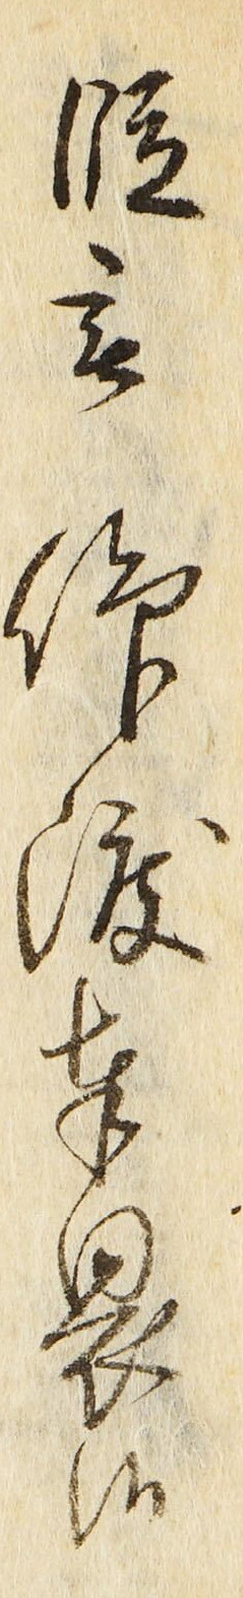段被仰渡奉畏候
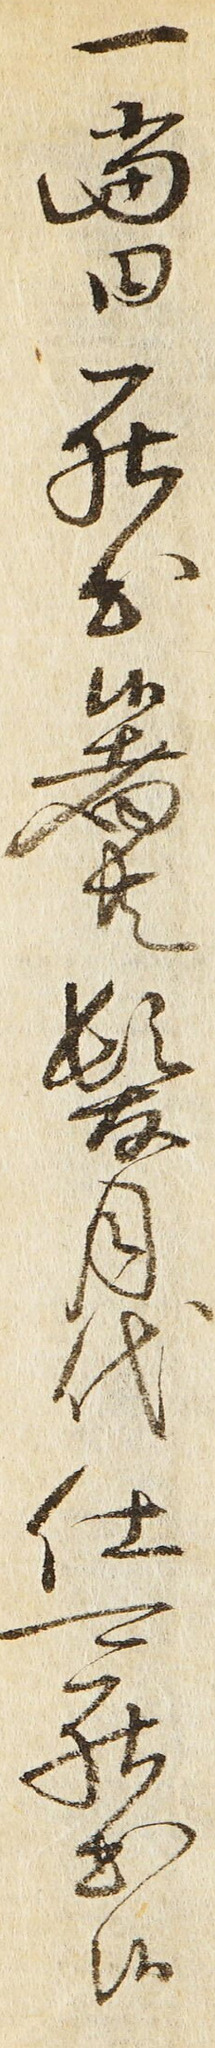一当日罷出候者共髪月代仕可罷出候
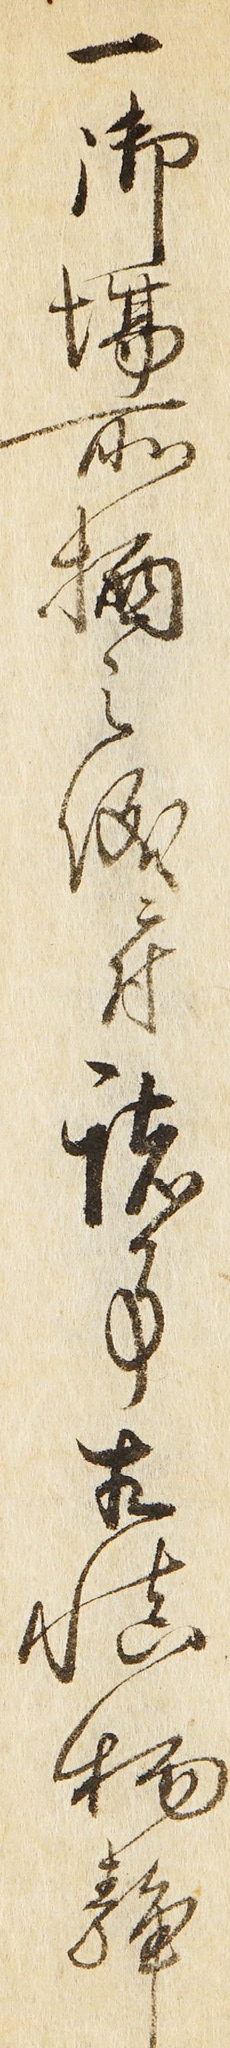一御場所柄之儀に付諸事相慎物静
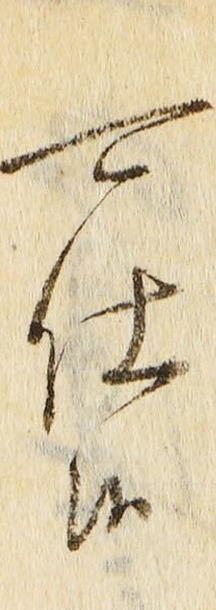可仕候
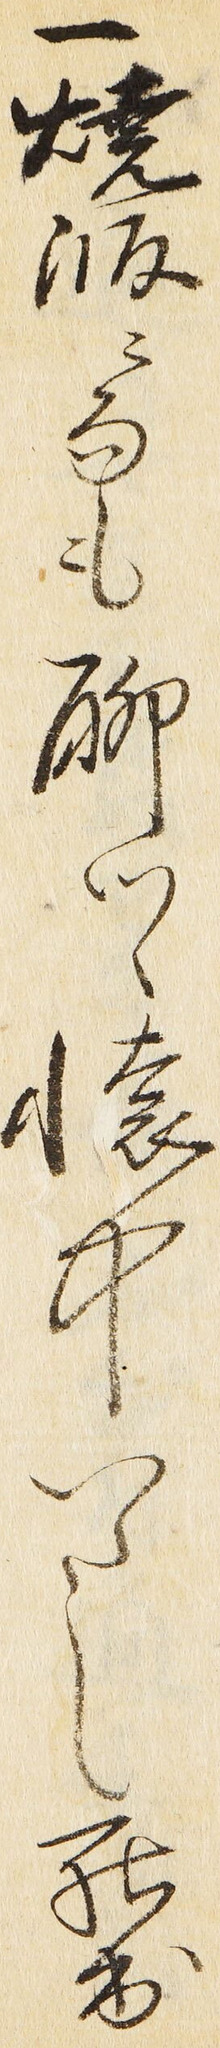一焼飯にても聊ツヽ懐中いたし罷出
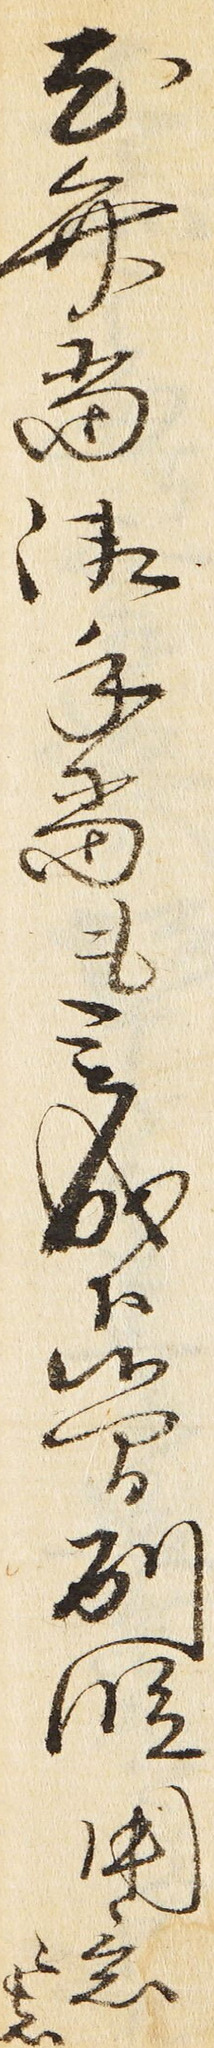尤弁当御手当も被成下候間別段用意には
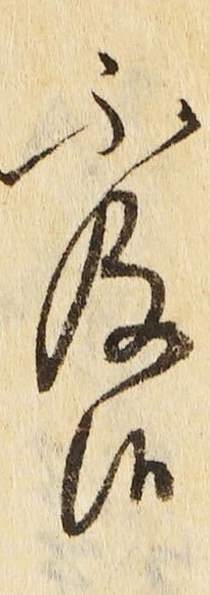不及候
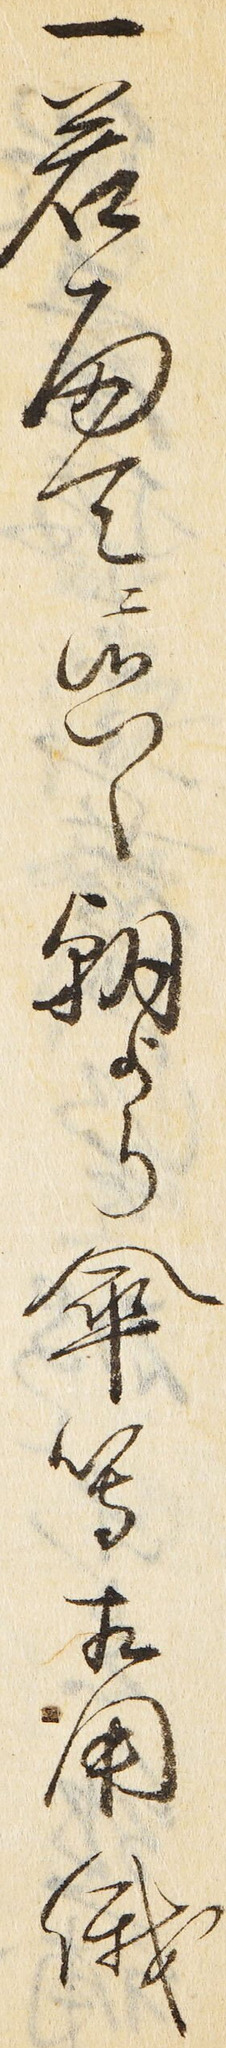一若雨天に候はゝ朝より傘等相用儀
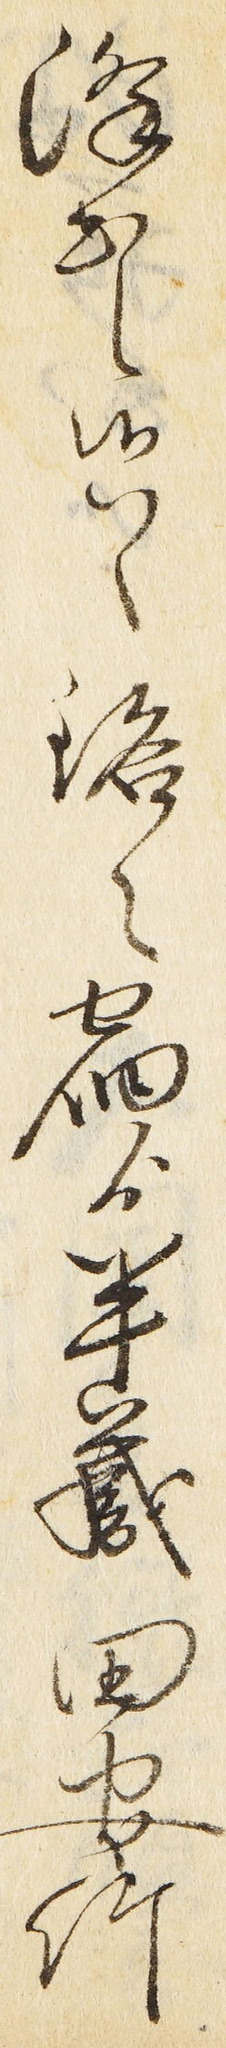降出し候はゝ銘々宿ゟ半蔵田安竹
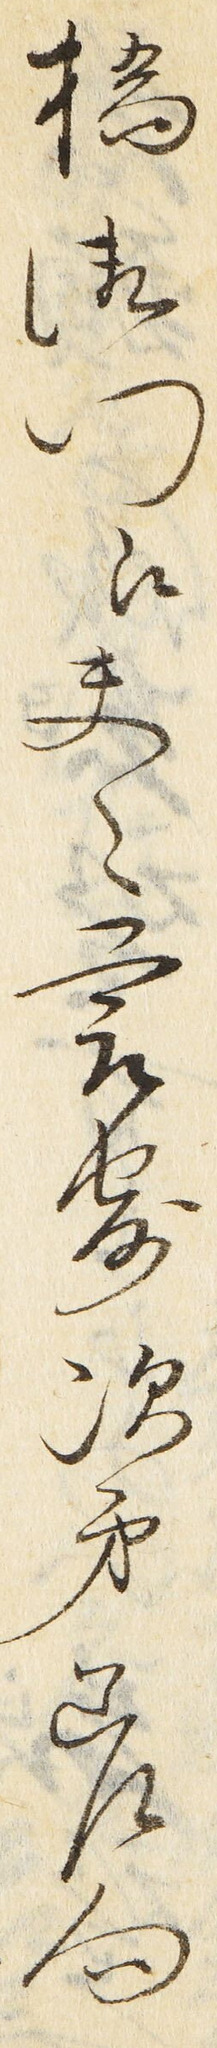橋御門江夫々最寄次第差向
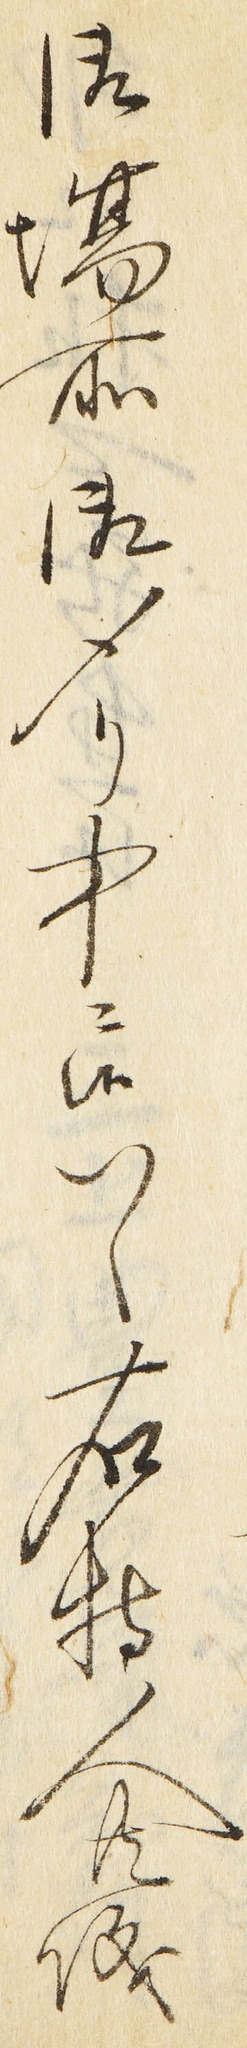御場所御〆り中に候はゝ右持人共儀
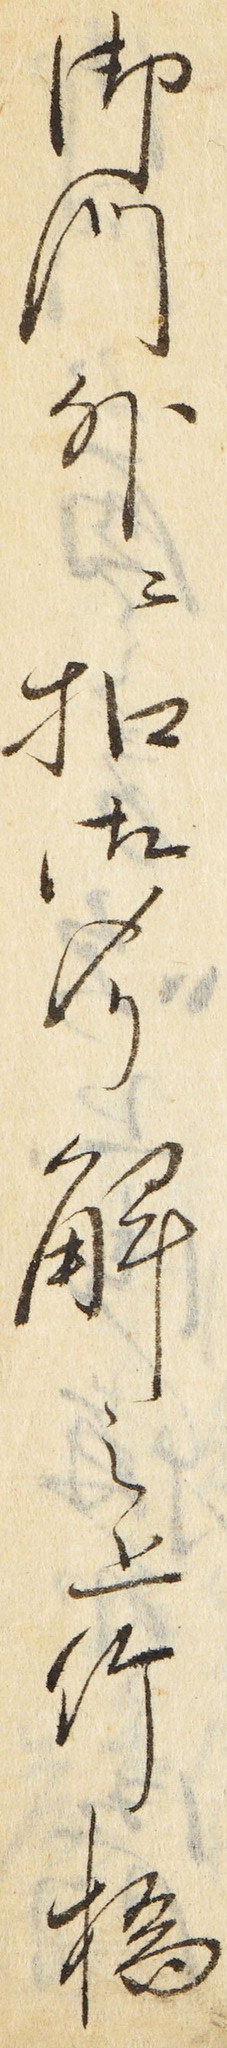御門外に扣御〆り解之上竹橋

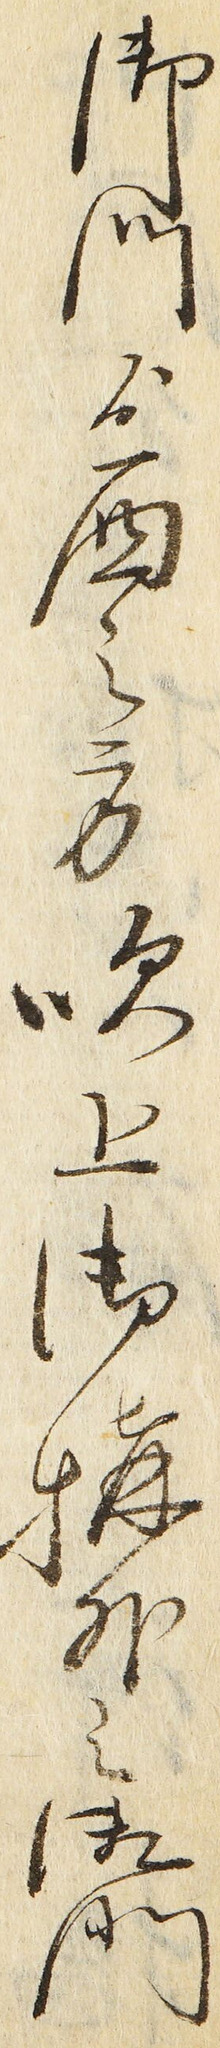御門ゟ西之方吹上御構外之御門
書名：異流一件日記
